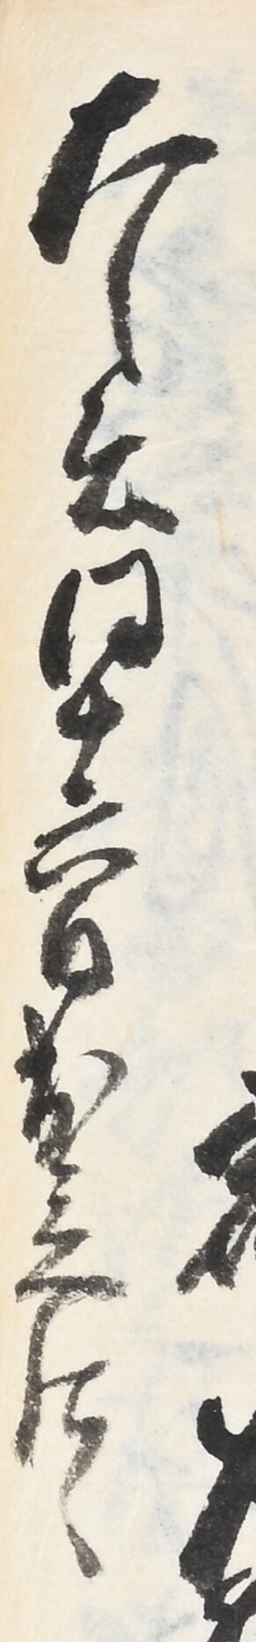右之者同十七日出立仕候
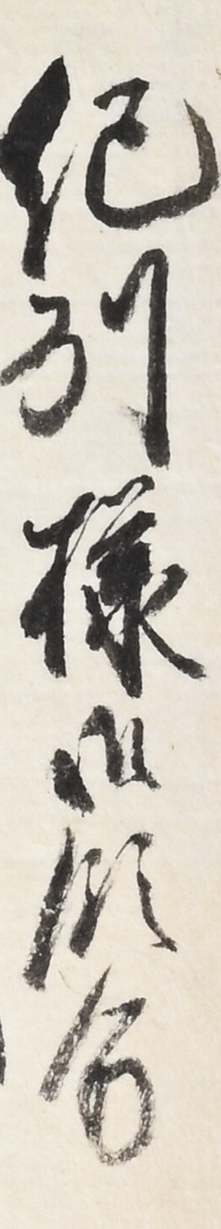紀州様御領分
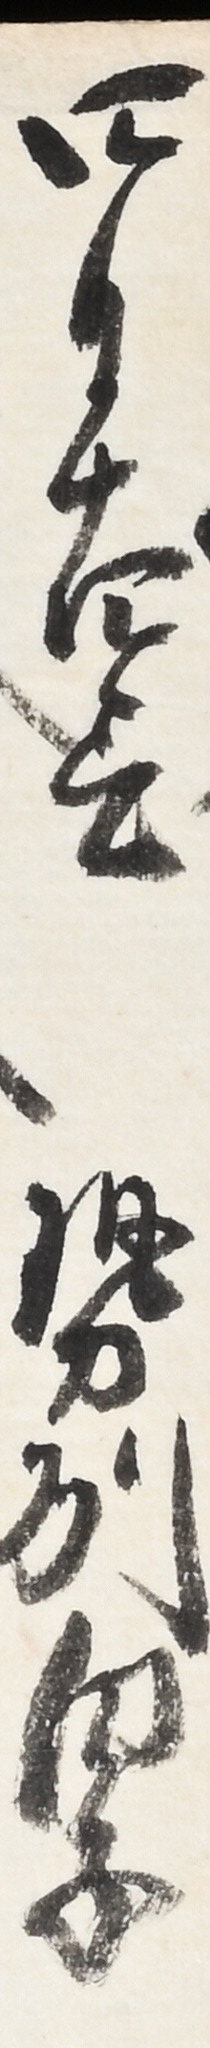四月十四日着勢州白子
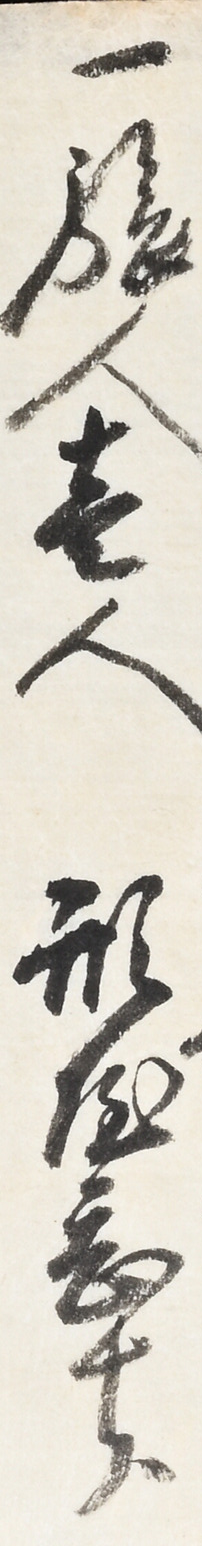一旅人壱人形屋甚十郎
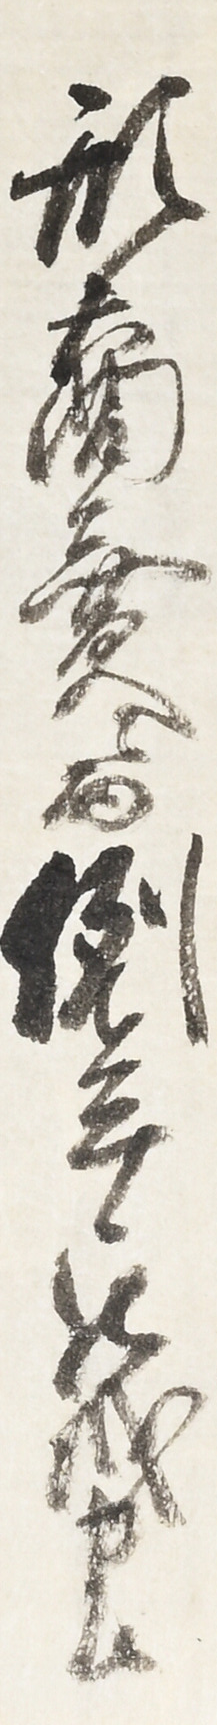形商売ニ而例年罷越申候
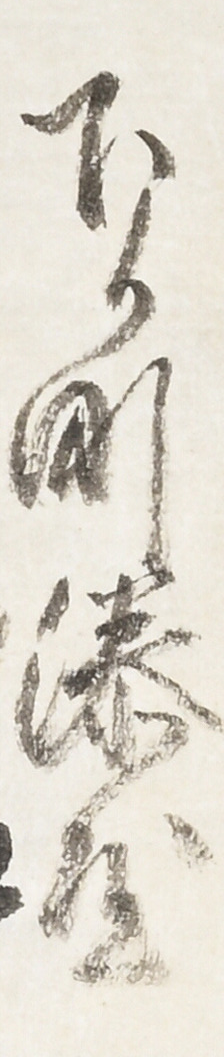下り町湊屋
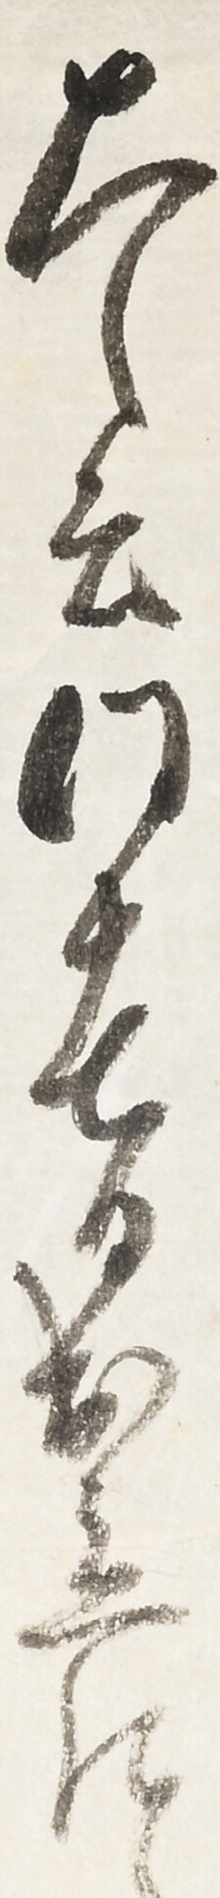右之者同十七日出立仕候
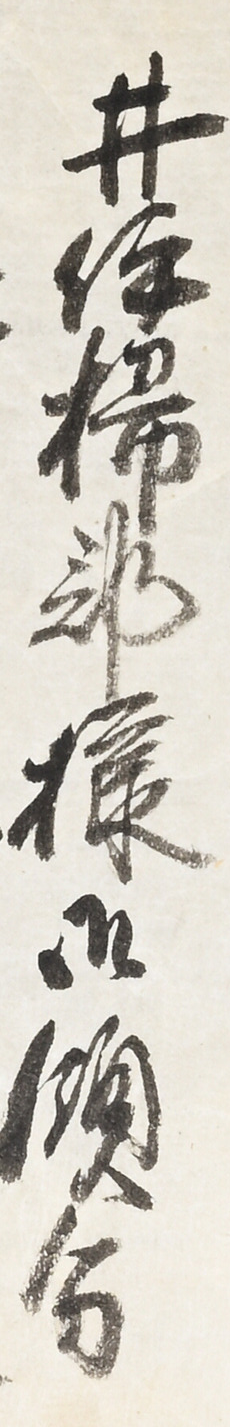井伊掃部頭様御領分
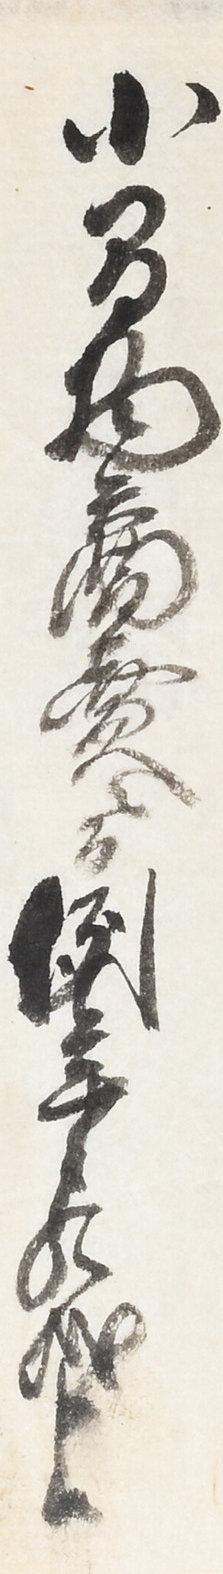小間物商売ニ而例年罷越申候
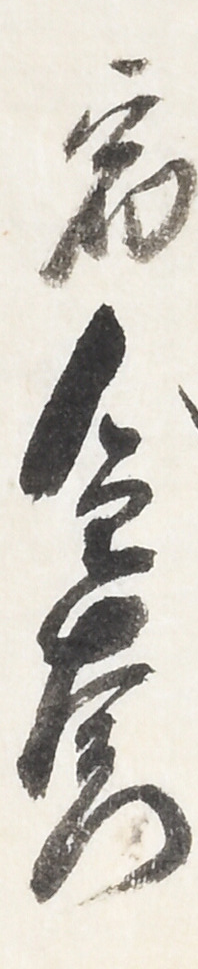宿金右衛門
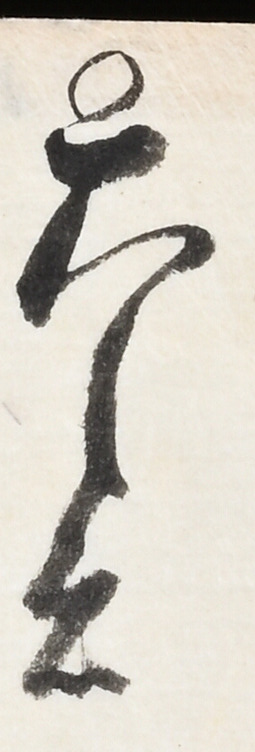〇右之者
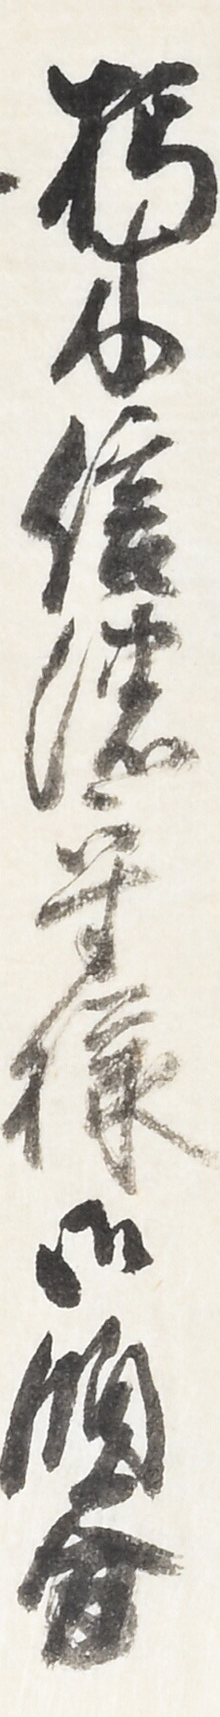朽木信濃守様御領分
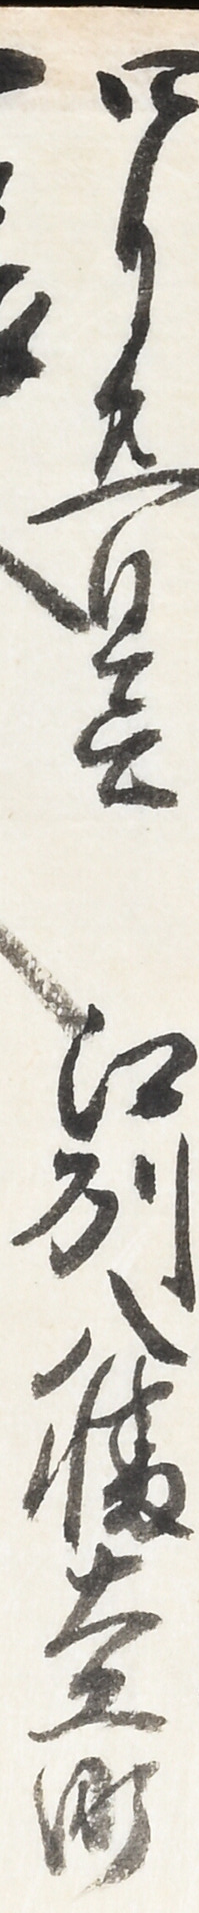四月廿一日着江州八幡大工町
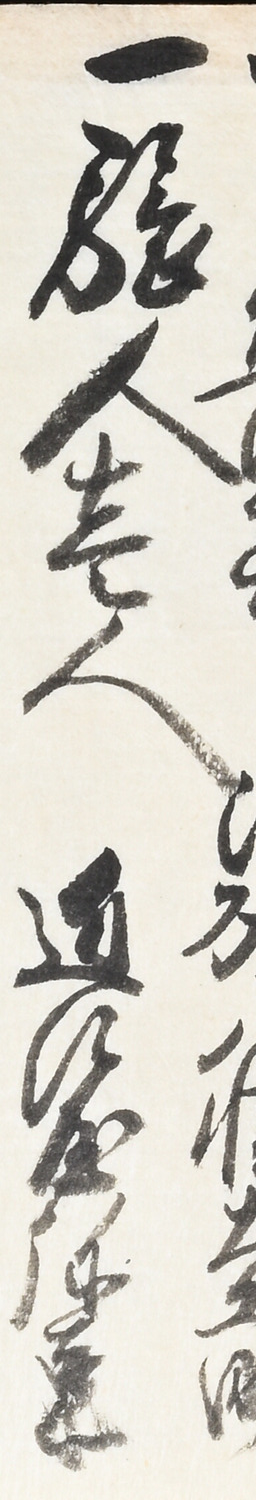一旅人壱人近江屋弥兵衛
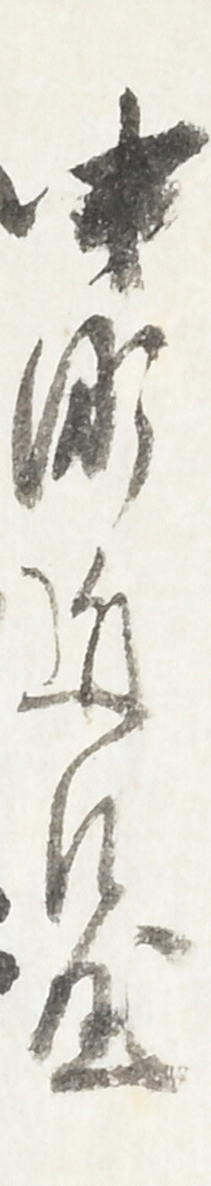中町近江屋
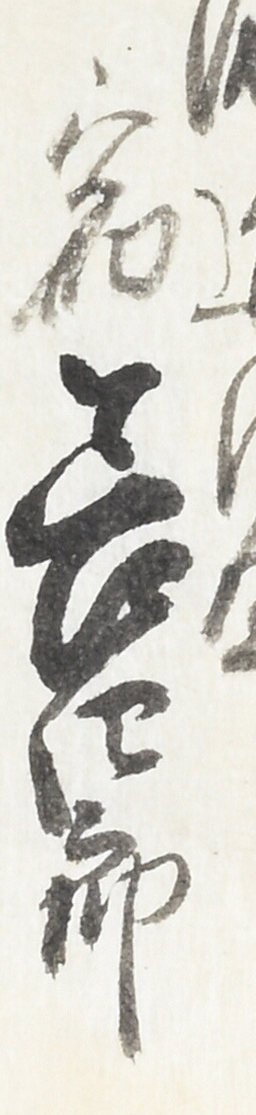宿善四郎
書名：旅人泊控帳
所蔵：伊那市立高遠町図書館・合同会社AMANE
